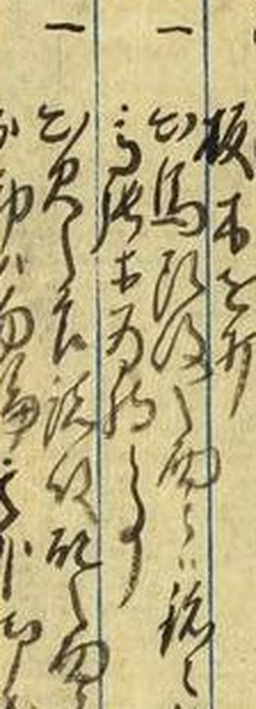高張等為持候事
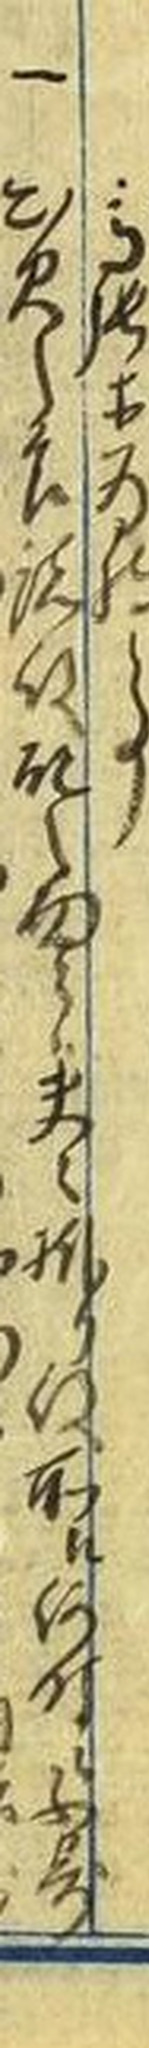一出火之節諸役衆之面々は夫々掛り役所え何時に不寄
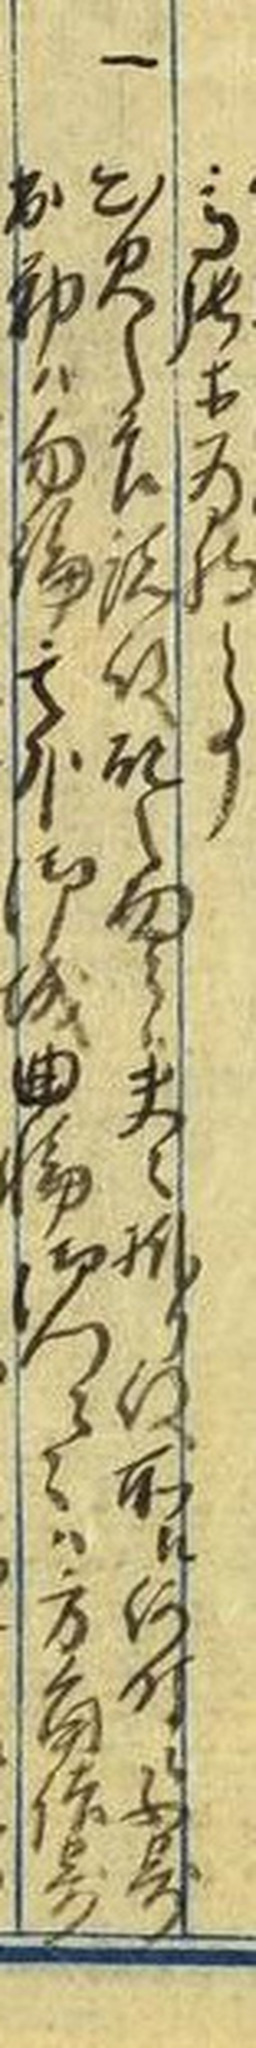出動勿論其外御城曲輪御門にては方角詰寄
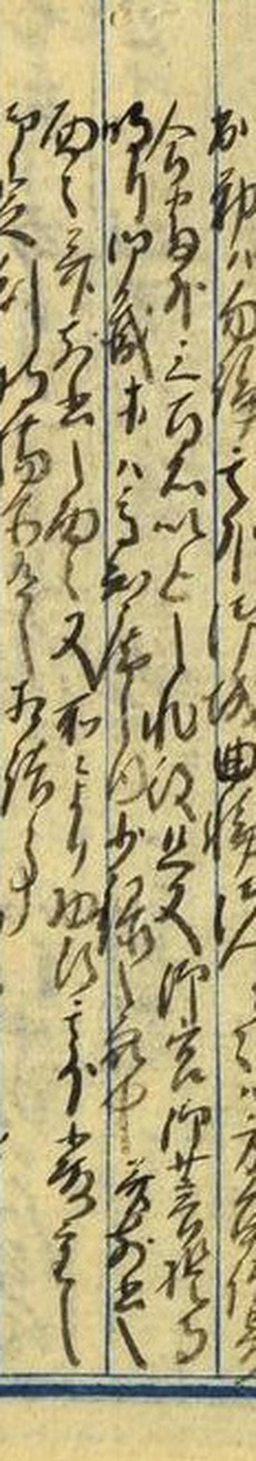明り御蔵等は高知序之内少禄之衆中并前書之
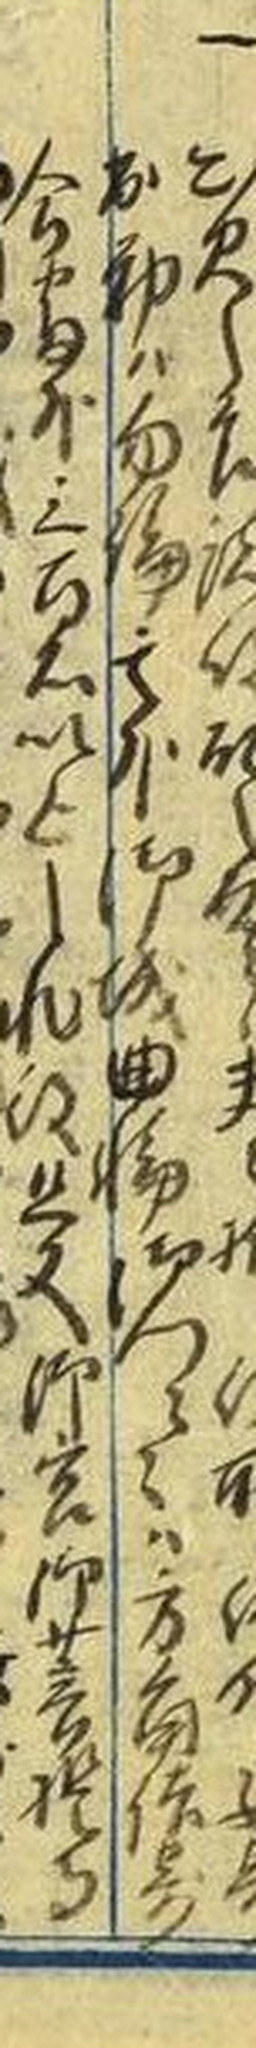合番外三百石以上之非役且又御宮御菩提寺
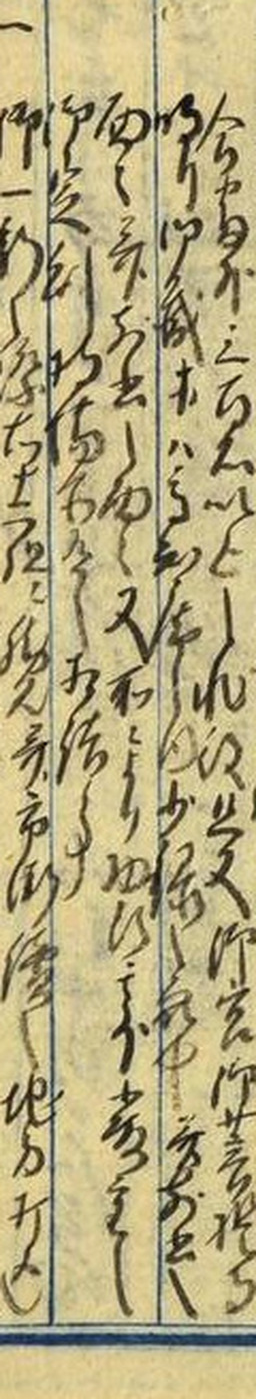面々并前書之面々又所により物頭其外厳重之
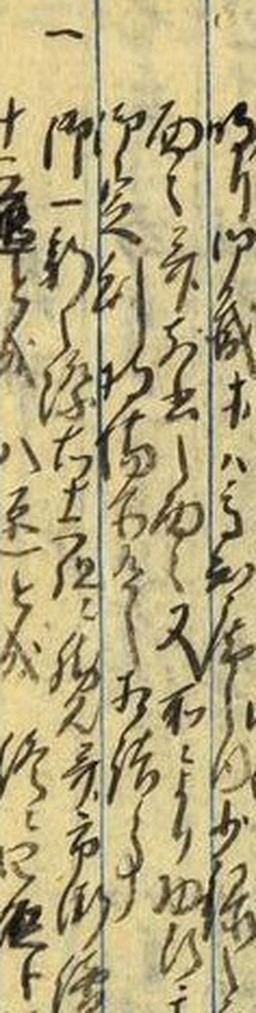御定則餅場所有之相詰候事
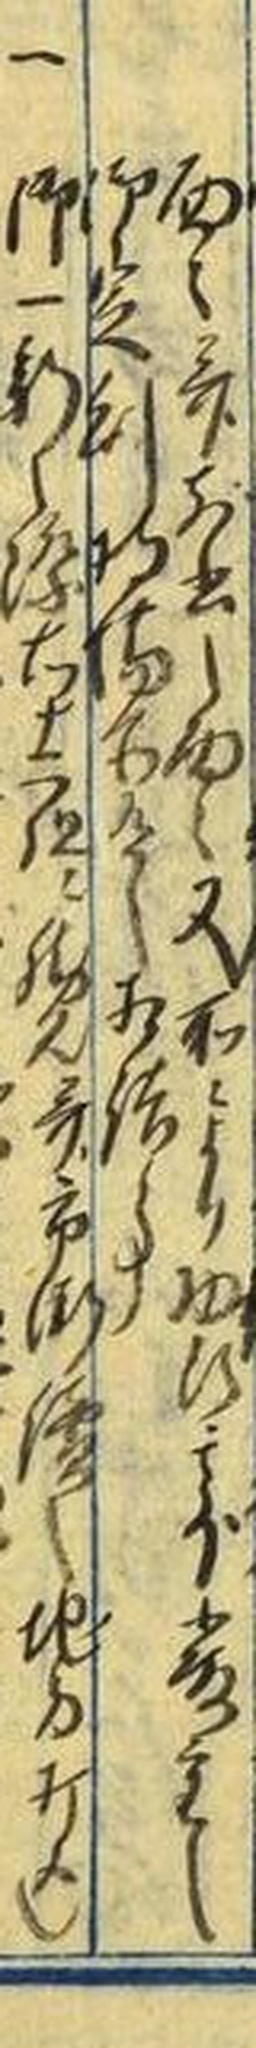一御一新之際右十二組に勝見并市街続之地方打込
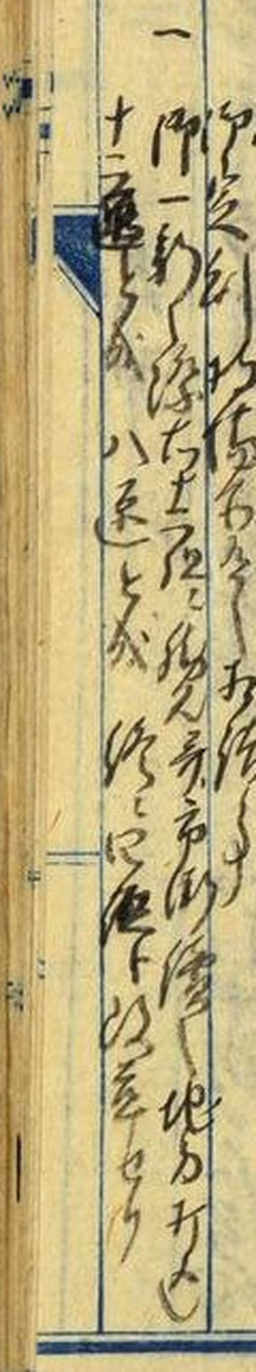十三組と成は区と成終に四組と改革せり

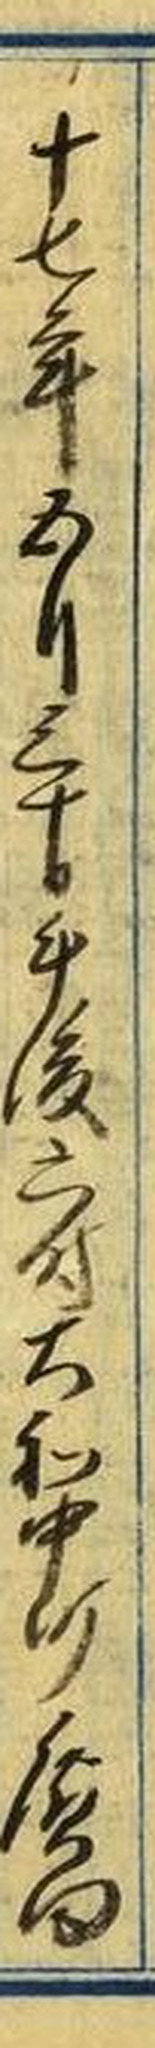十七年五月三十日午後六時大和中町広田
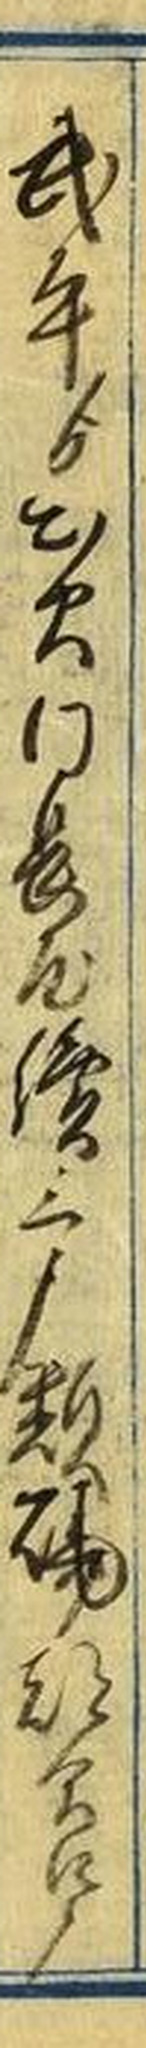武平ゟ出火同長屋続三戸類焼都合四戸
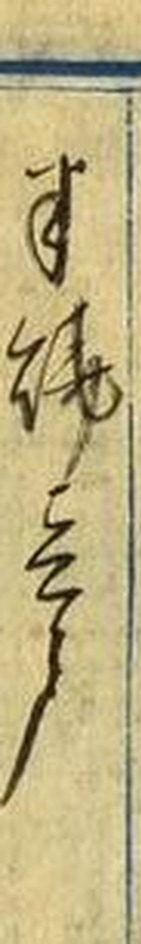半焼壱戸
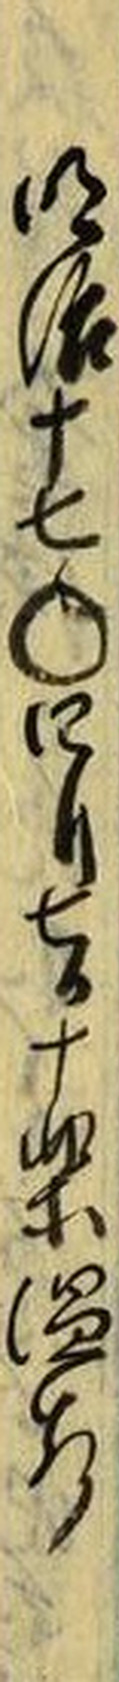明治十七年四月七日十楽温泉
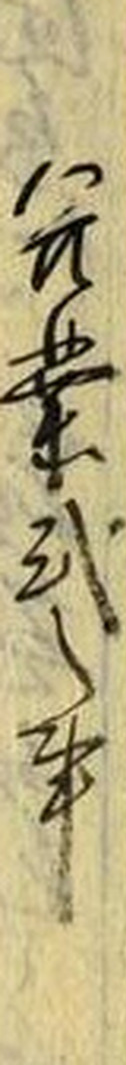開業式之事
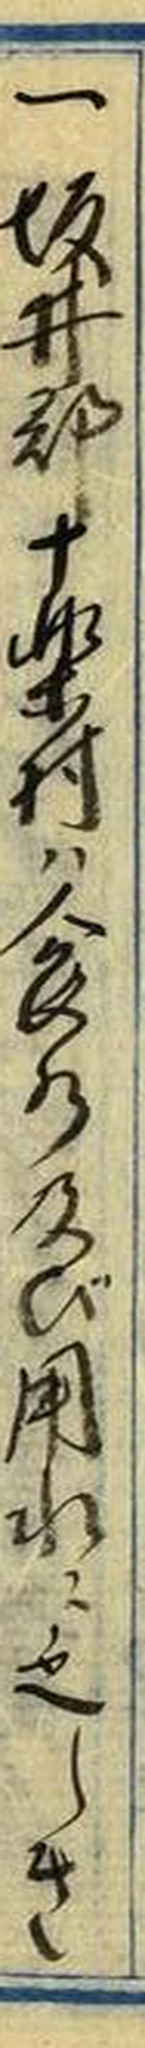一坂井郡十楽村は食水及び用水に乏しき
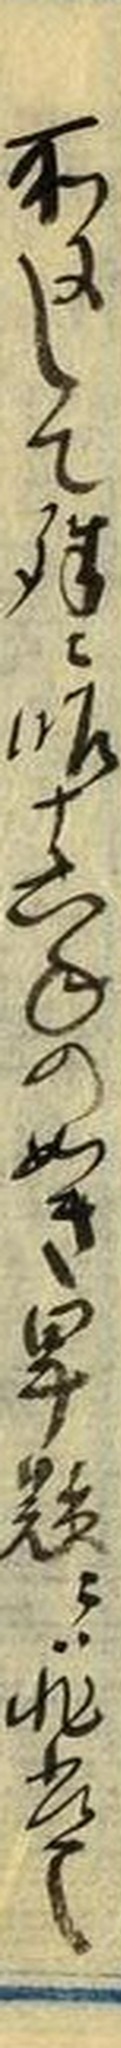所にして殊に昨十六年の如き旱魃には非常之
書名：温古集 五巻
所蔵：福井県文書館 Fukui Prefectural Archives
